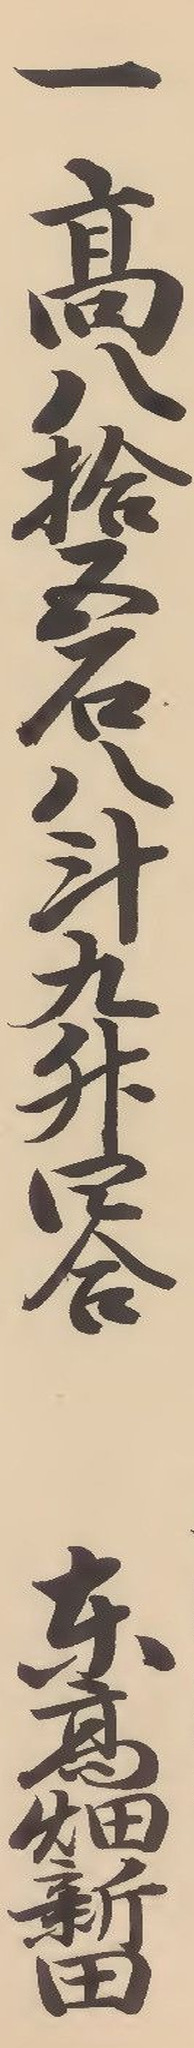一高八拾五石八斗九升四合東高畑新田
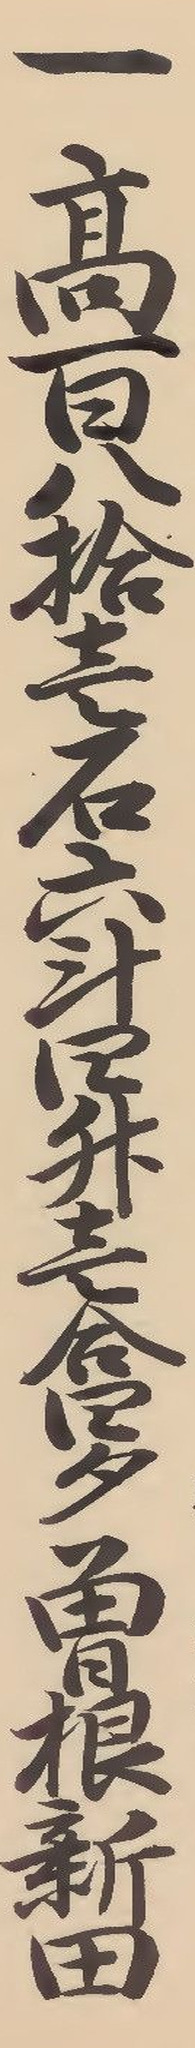一高百八拾壱石六斗四升壱合四タ曽根新田

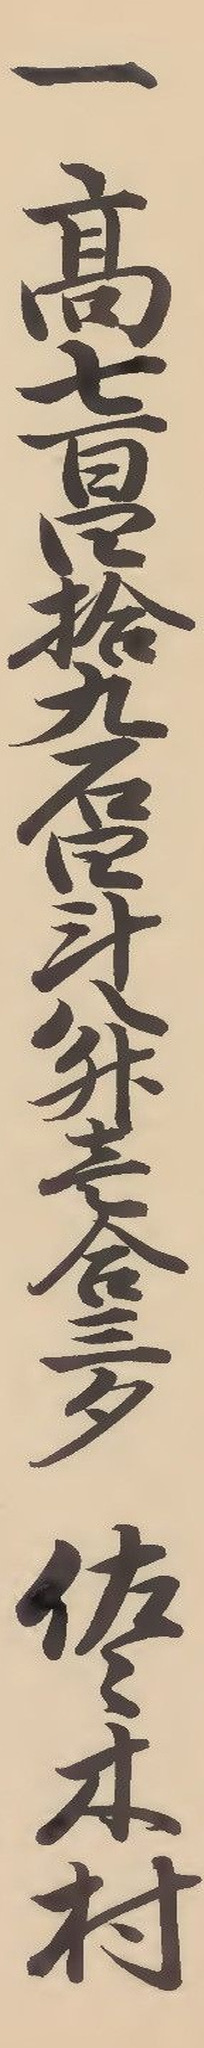一高七百四拾九石四斗八升壱合三勺佐々木村
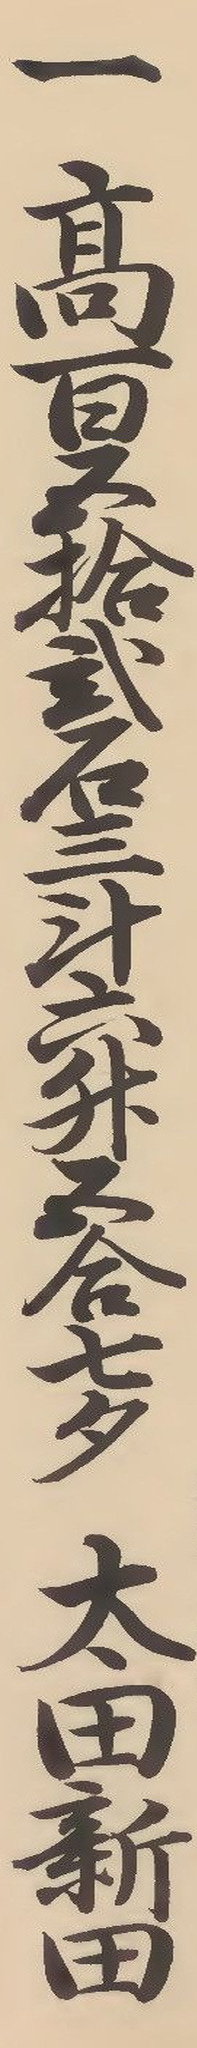一高百五拾弐石三斗六升五合七勺太田新田
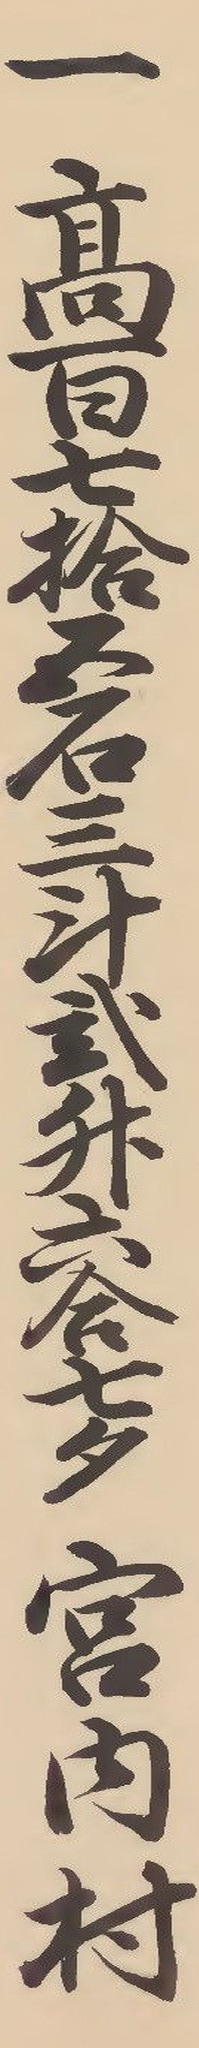一高百七拾五石三斗弐升六合七勺宮内村
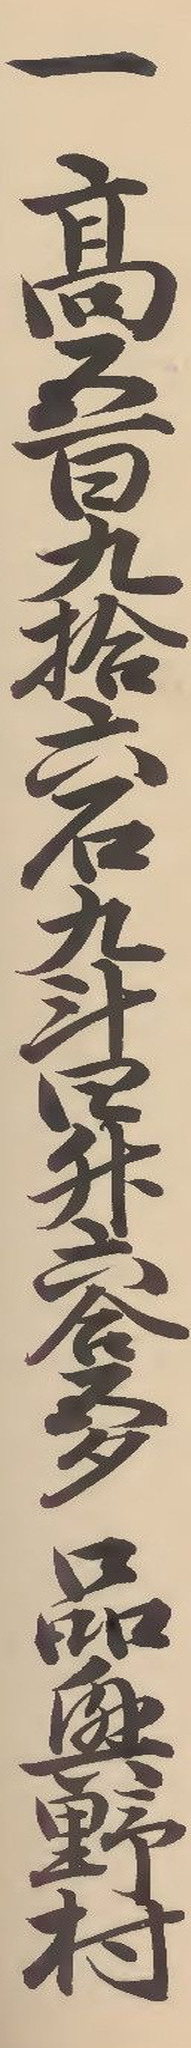一高五百九拾六石九斗四升六合五勺品興野村
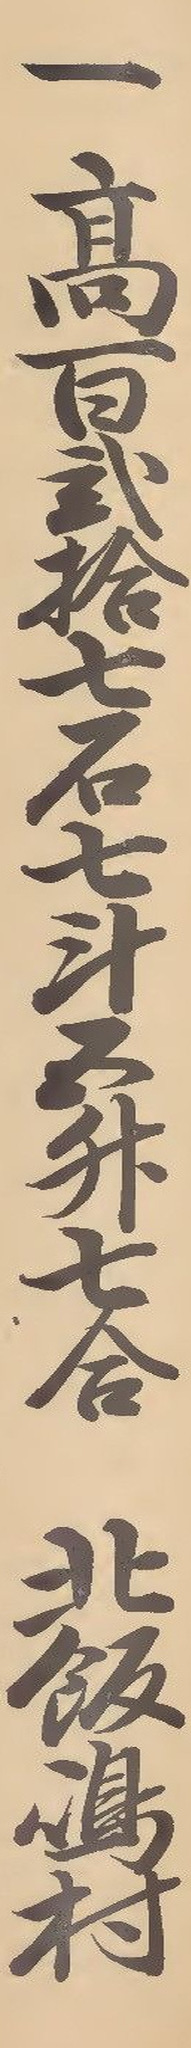一高百弐拾七石七斗五升七合北飯島村
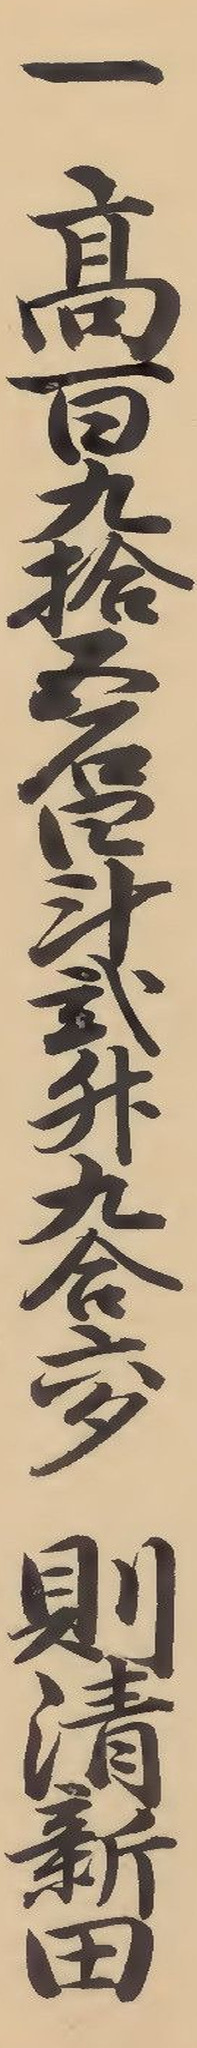一高百九拾五石四斗弐升九合六勺則清新田
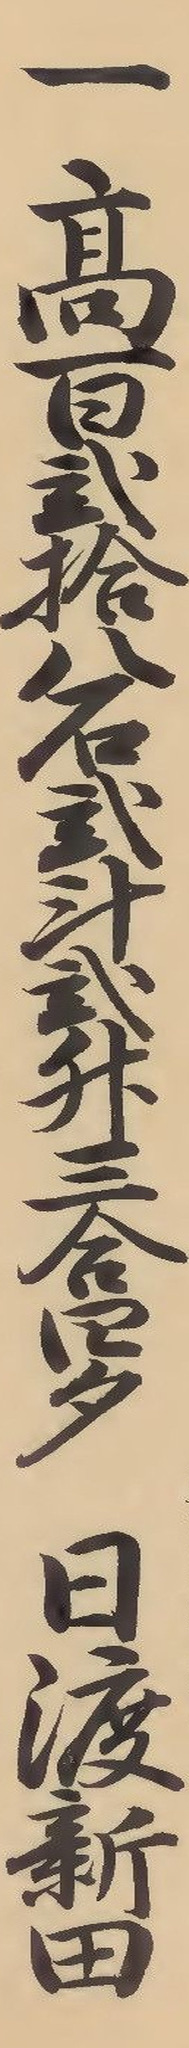一高百弐拾八石弐斗弐升三合四勺日渡新田
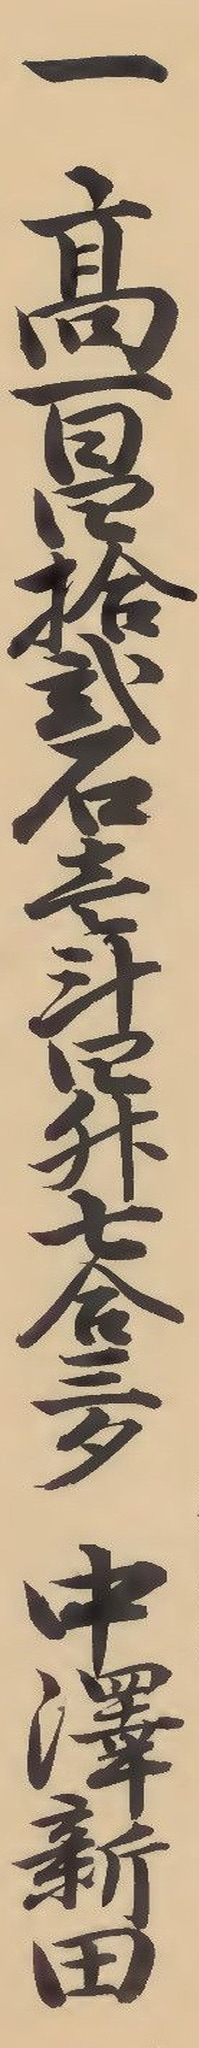一高百四拾弐石壱斗四升七合三勺中沢新田

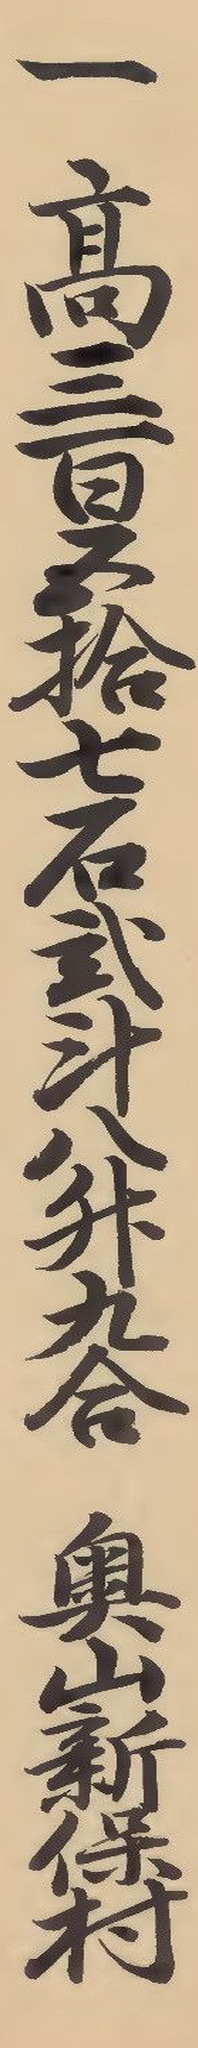一高三百五拾七石弐斗八升九合奥山新保村
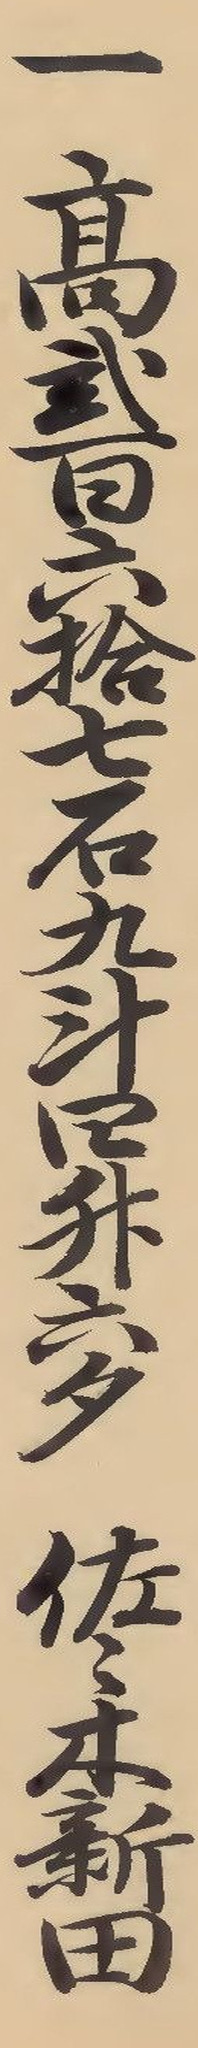一高弐百六拾七石九斗四升六勺佐々木新田
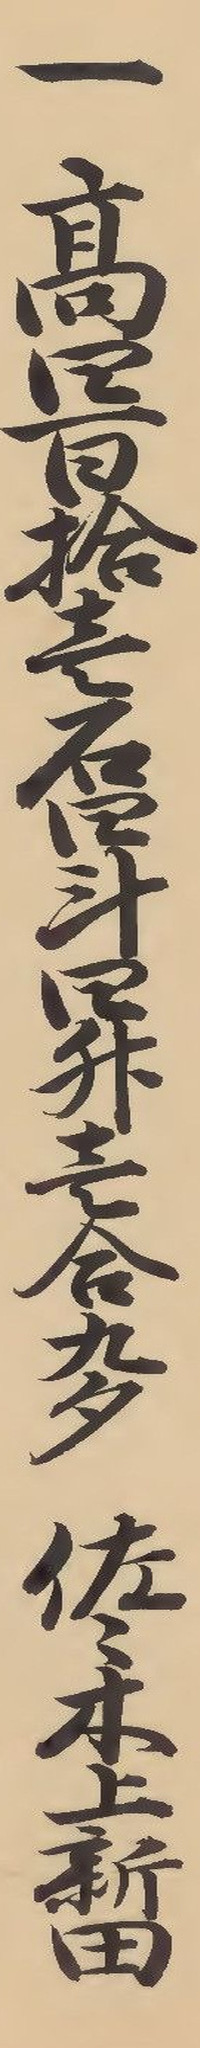一高四百拾壱石四斗四升壱合九勺佐々木上新田
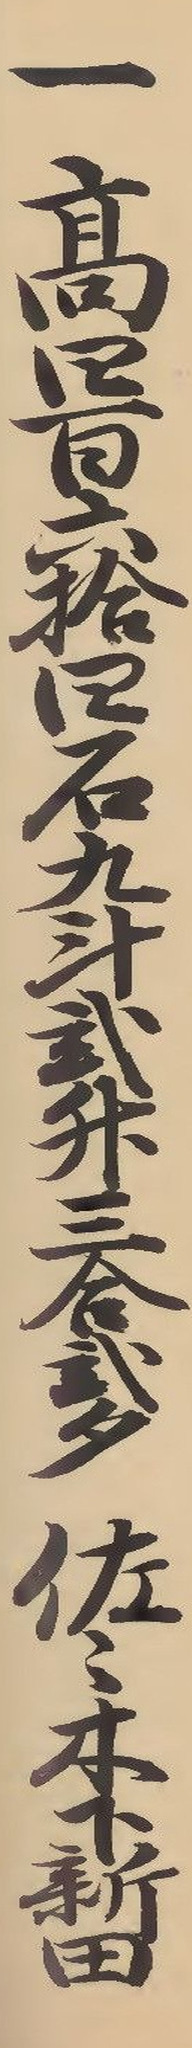一高四百六拾四石九斗弐升三合弐勺佐々木下新田
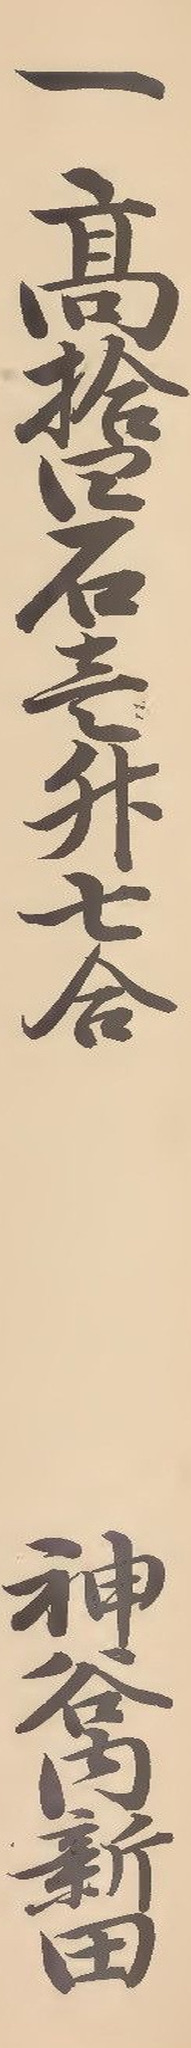一高拾四石壱升七合神谷内新田
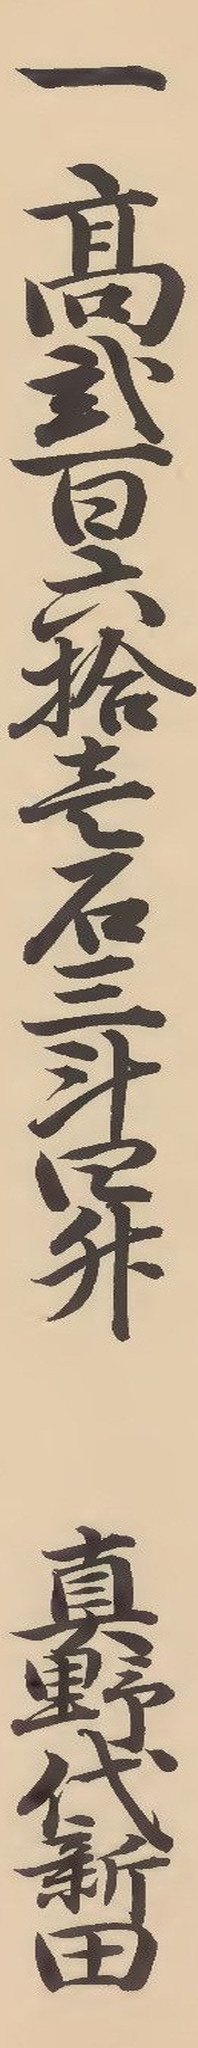一高弐百六拾壱石三斗四升真野代新田
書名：越後国郷帳　下
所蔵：国立公文書館 National Archives of Japan
